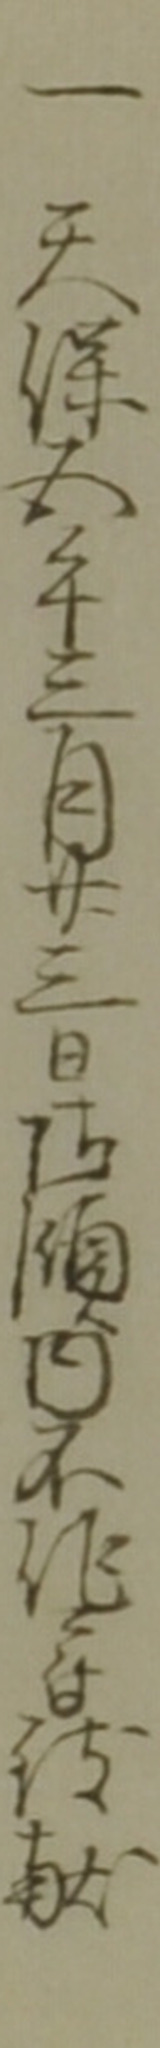一天保五午三月廿三日御領内不作ニ付致献
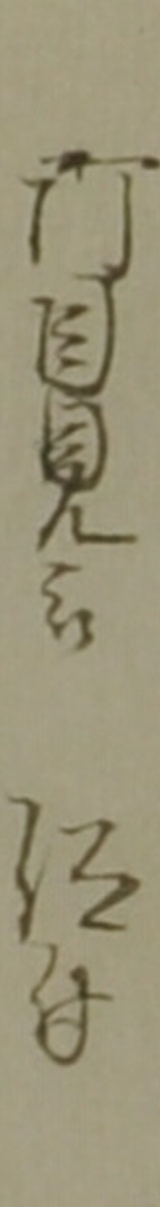御目見被仰付
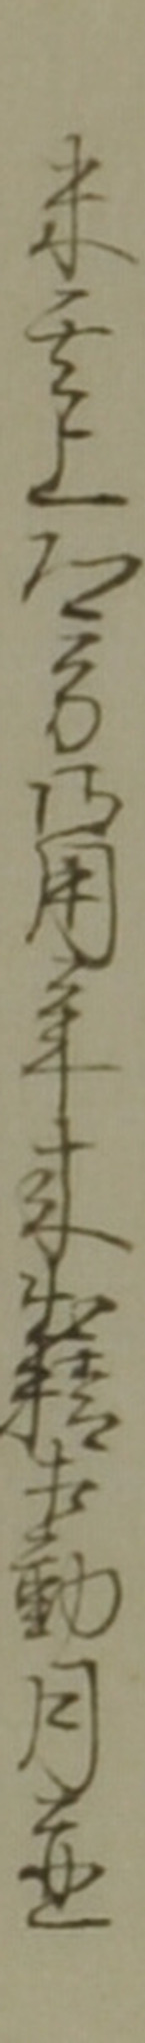米其上郷方御用年来出精相勤月並
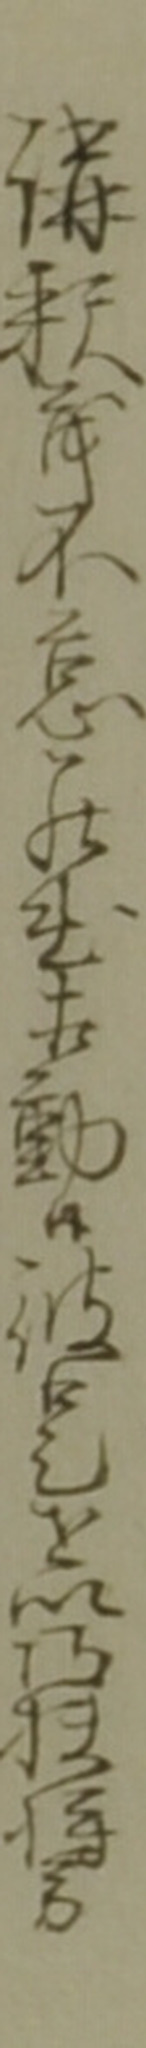講釈茂不怠罷出相勤候彼是を以御扶持方
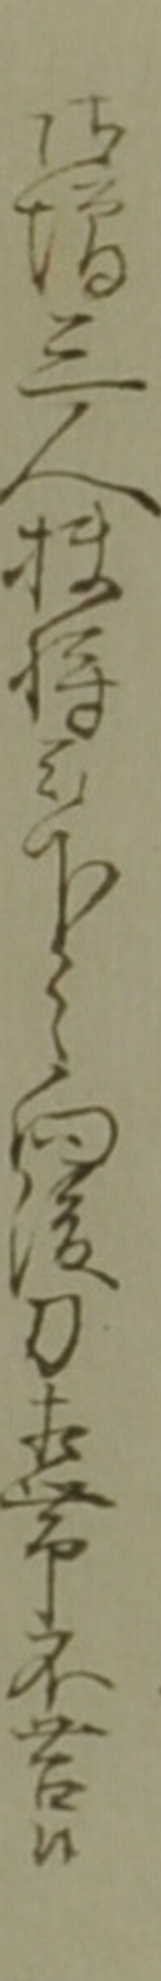御増三人扶持被下之向後刀相帯不苦候
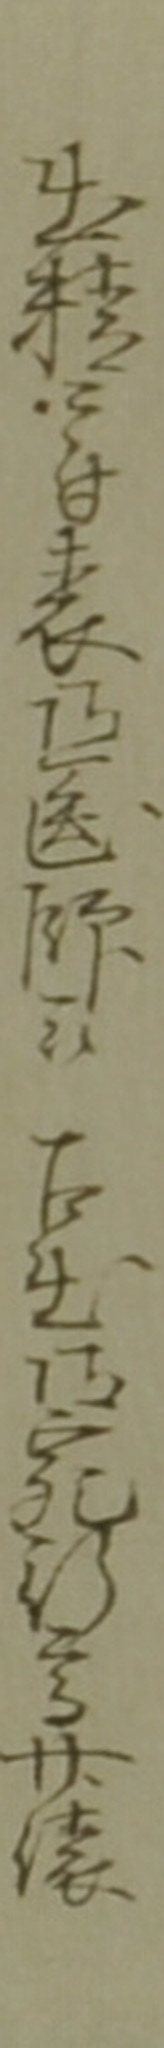出精ニ付表御医師被召出御宛行高廿俵
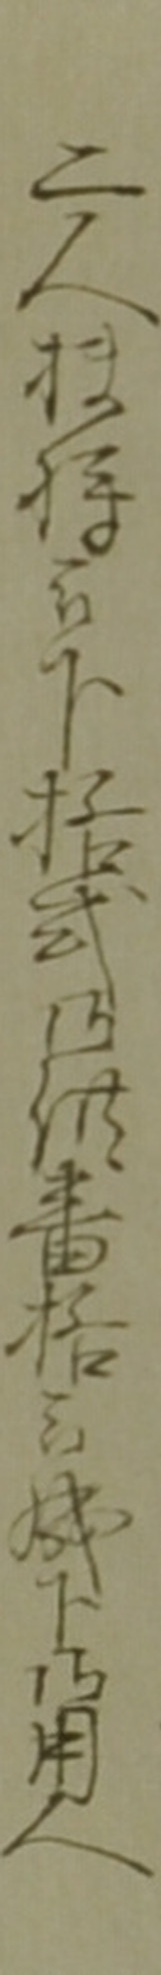二人扶持被下格式御供書格被成下御用人
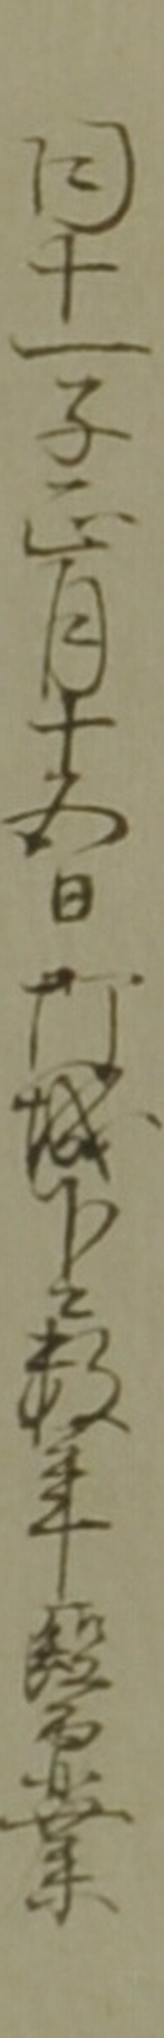一同十一子正月十五日御城下ニ数年医業

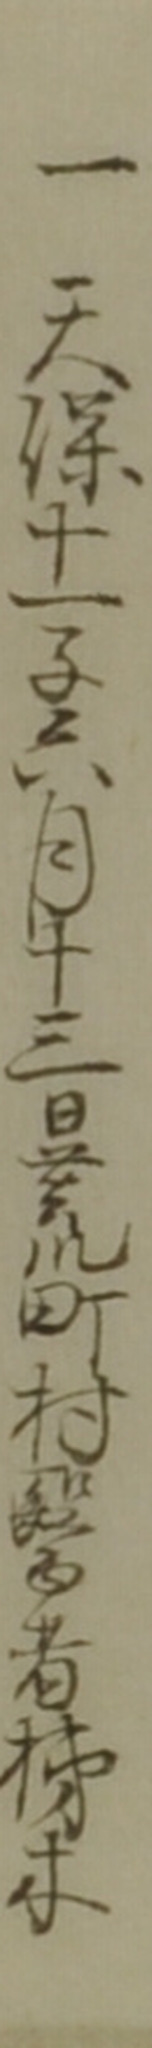一天保十一子六月十三日荒町村医者柿木
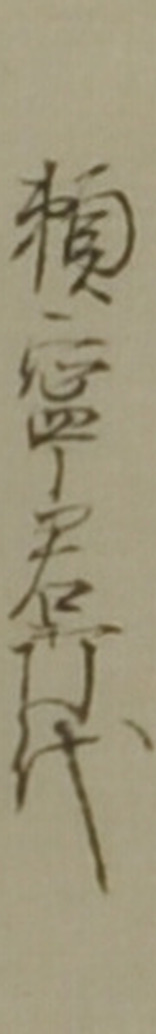頼寧君御代
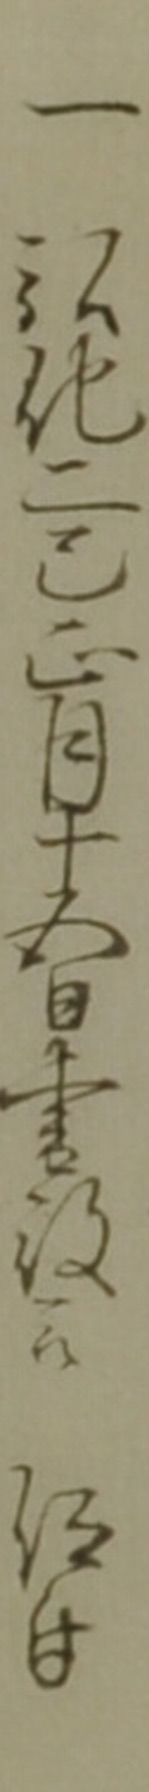一弘化二巳正月十五日書役被仰付
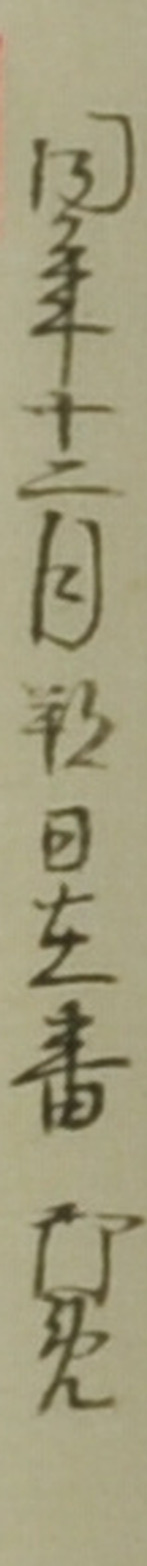一同年十二月朔日在番御免
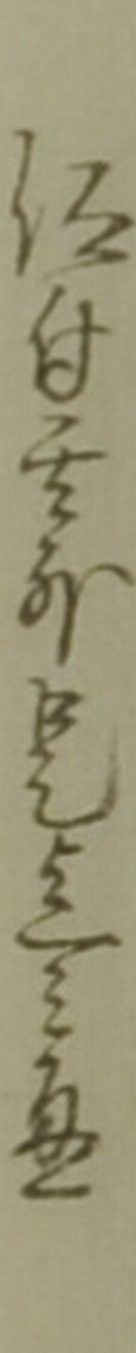仰付其外是迄之通
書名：無足諸士勤仕録（六）
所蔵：伊那市立高遠町図書館・合同会社AMANE
